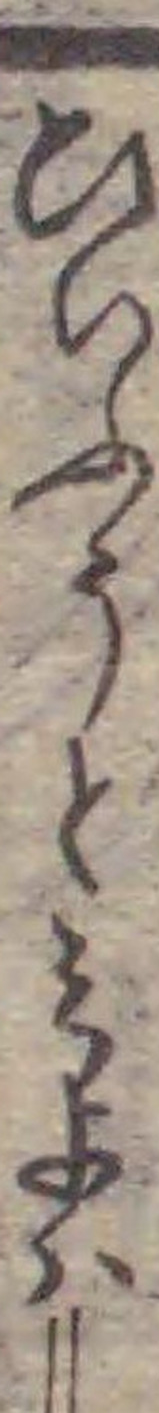ひいふうとみよは
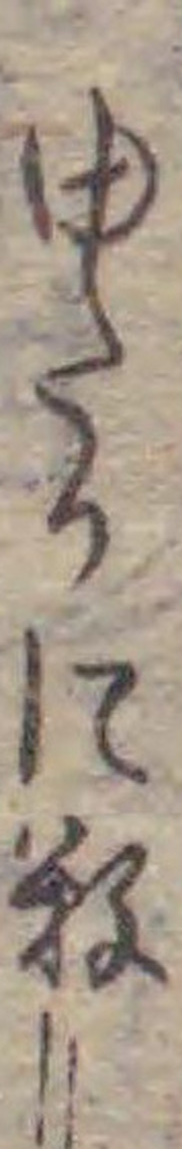ゆたかに数
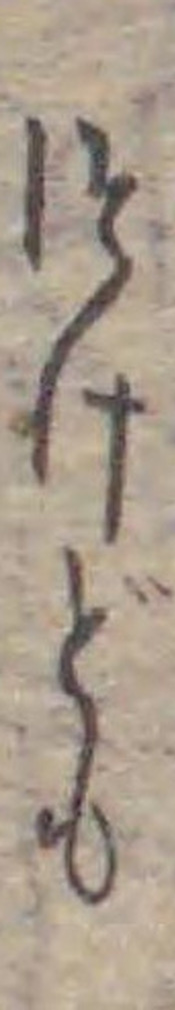つけども
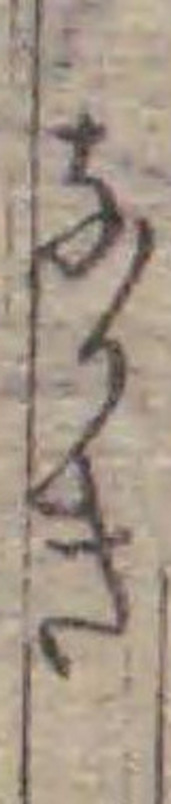なかき
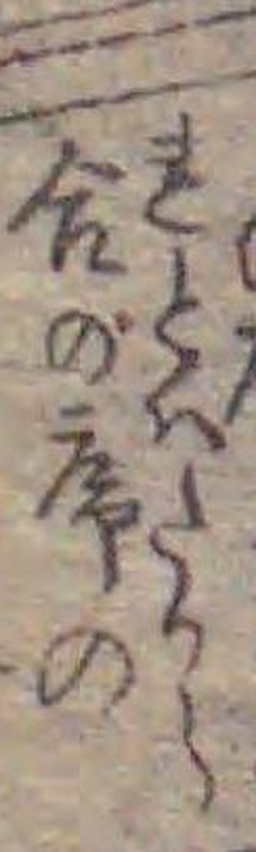合の席の

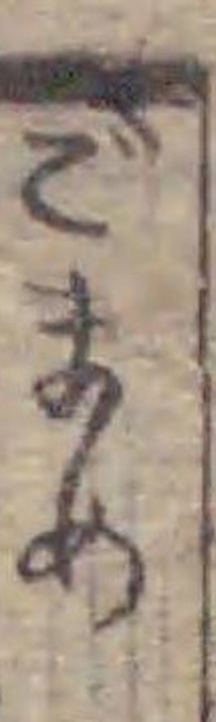ごまめ
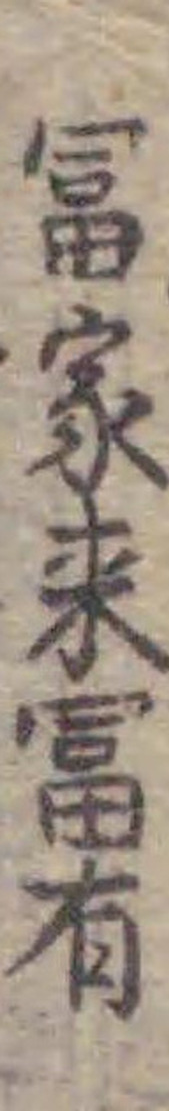富永来富有
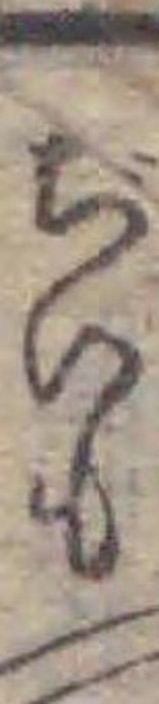ぢいも
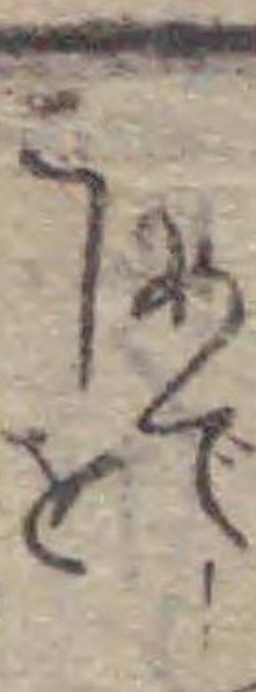こしを
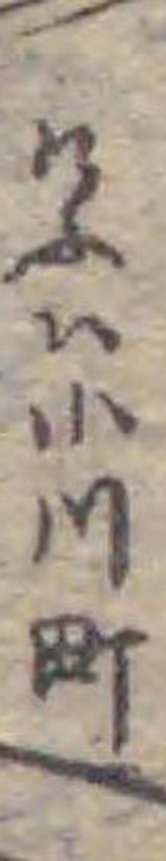けふは小川町
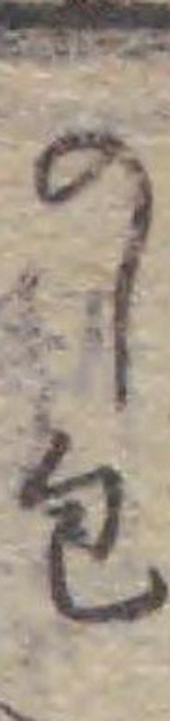のし包
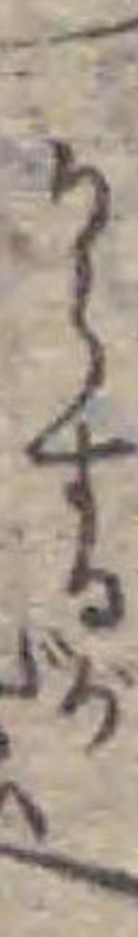からするが
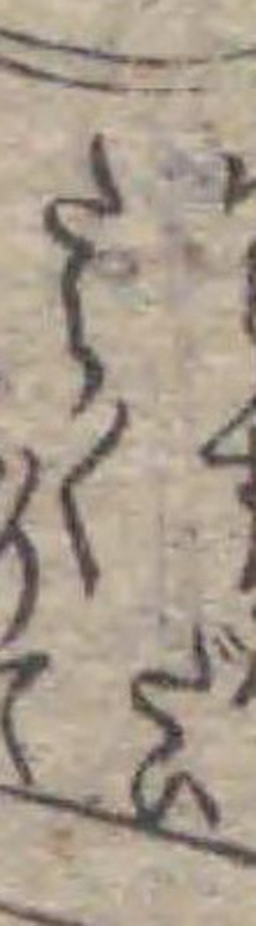たら〳〵
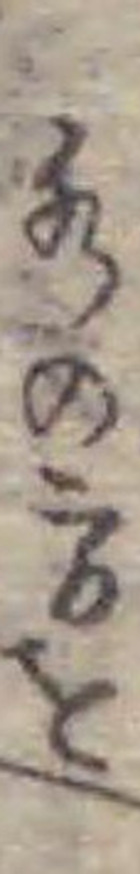水の方を
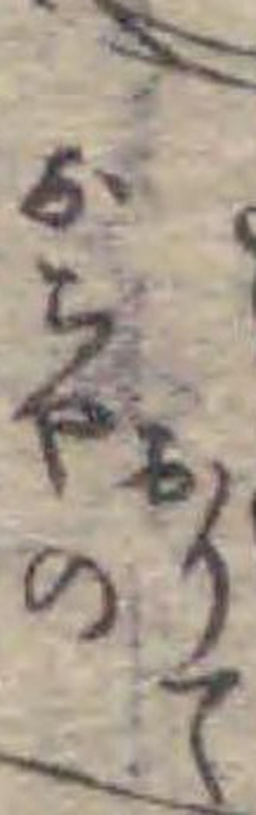おちやの
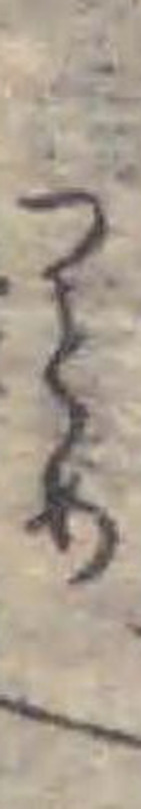つとめ
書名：年始御礼帳 : 3巻
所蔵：国立国会図書館 National Diet Library, JAPAN
